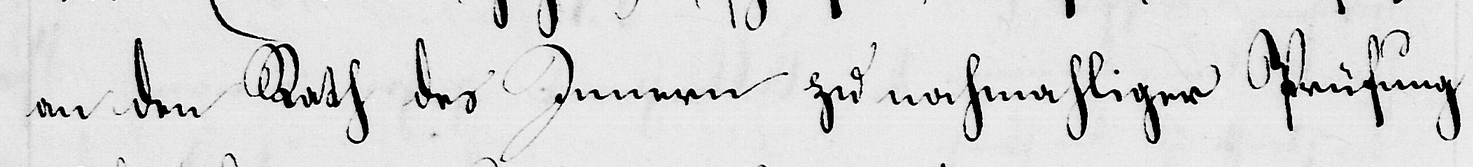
an den Rath des Innern zu nochmahliger Prüfung
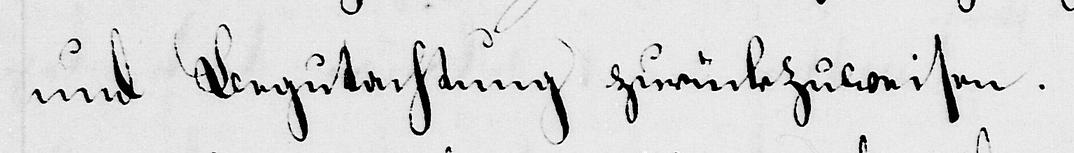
und Begutachtung zurückzuweisen.
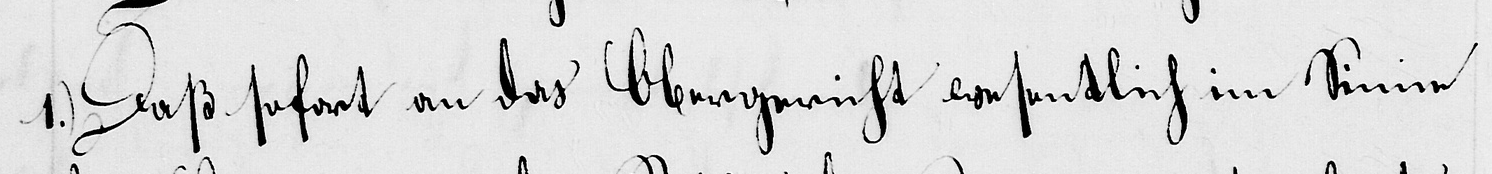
1.) Daß sofort an das Obergericht wesentlich im Sinne
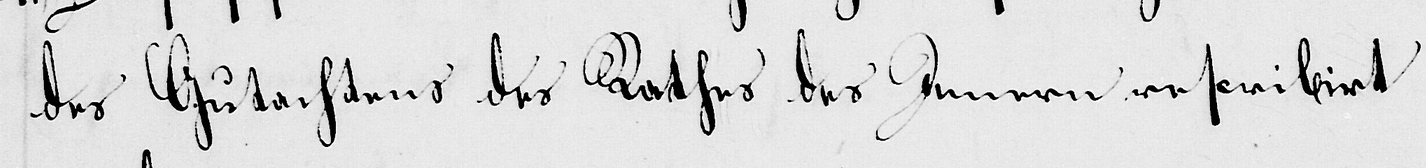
des Gutachtens des Rathes des Innern rescribirt
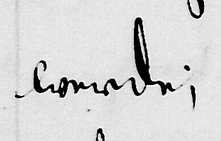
werde;
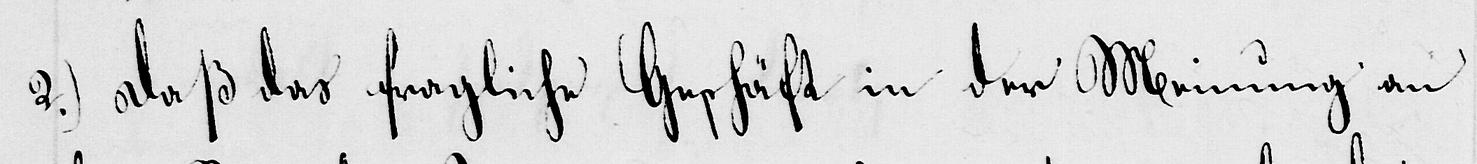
2.) Daß das fragliche Geschäft in der Meinung an
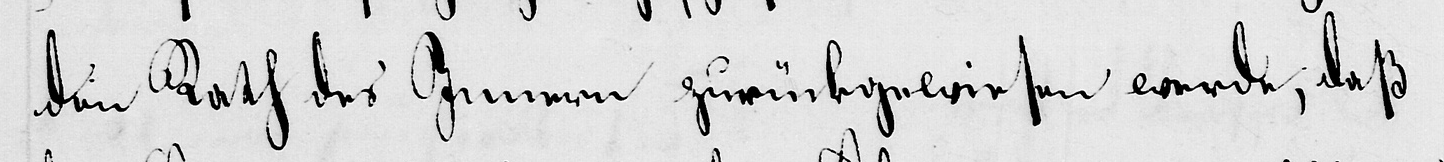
den Rath des Innern zurückgewiesen werde, daß
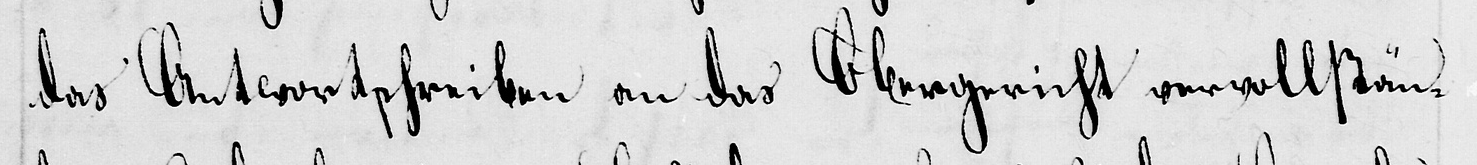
das Antwortschreiben an das Obergericht vervollstän¬
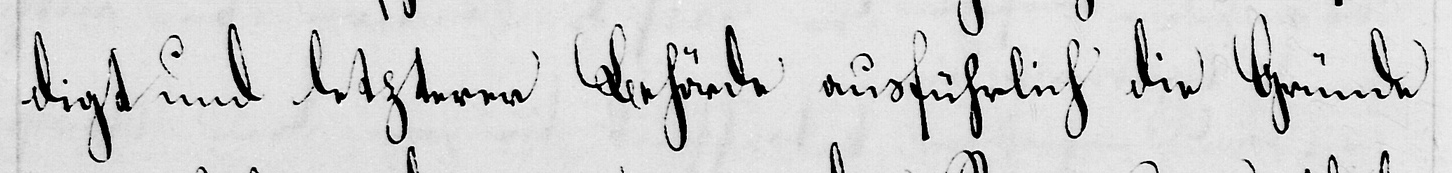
digt und letzterer Behörde ausführlich die Gründe
